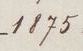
1876
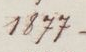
1877
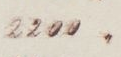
2200 "
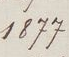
1877
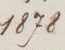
1878
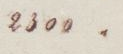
2300 "
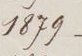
1879
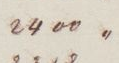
2400 "
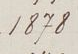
1880
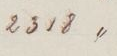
2318 "
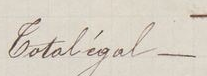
Total égal __
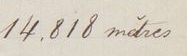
14.818 mètres
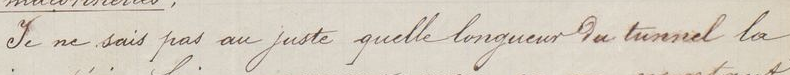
Je ne sais pas au juste quelle longueur du tunnel la
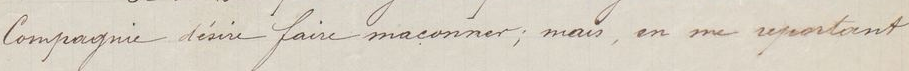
Compagnie désire faire maçonner; mais, en me reportant
